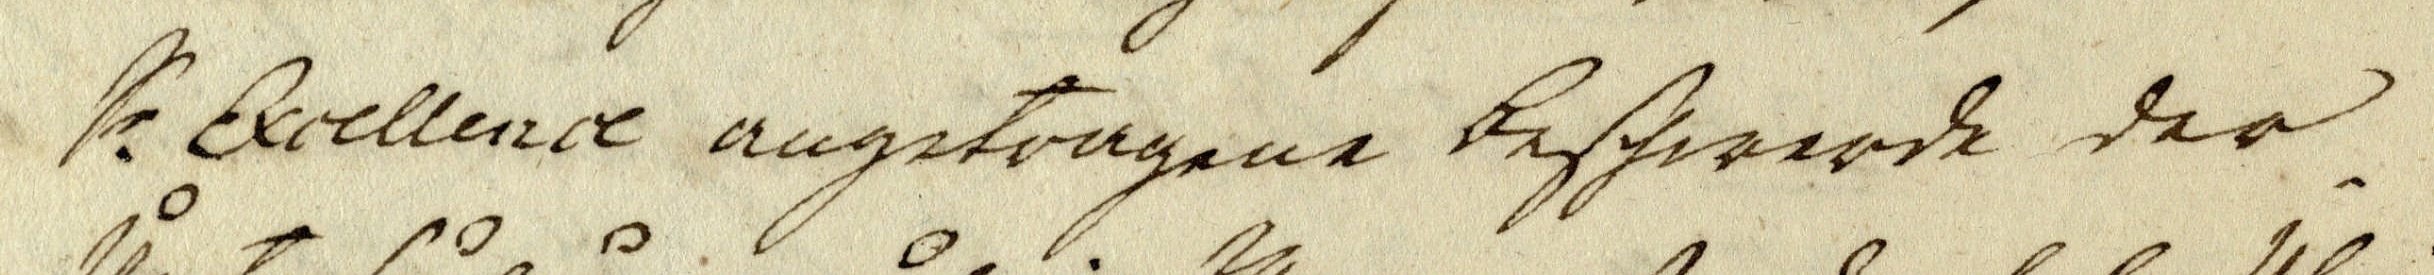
Sr Excellence angetragene Beschwerde der
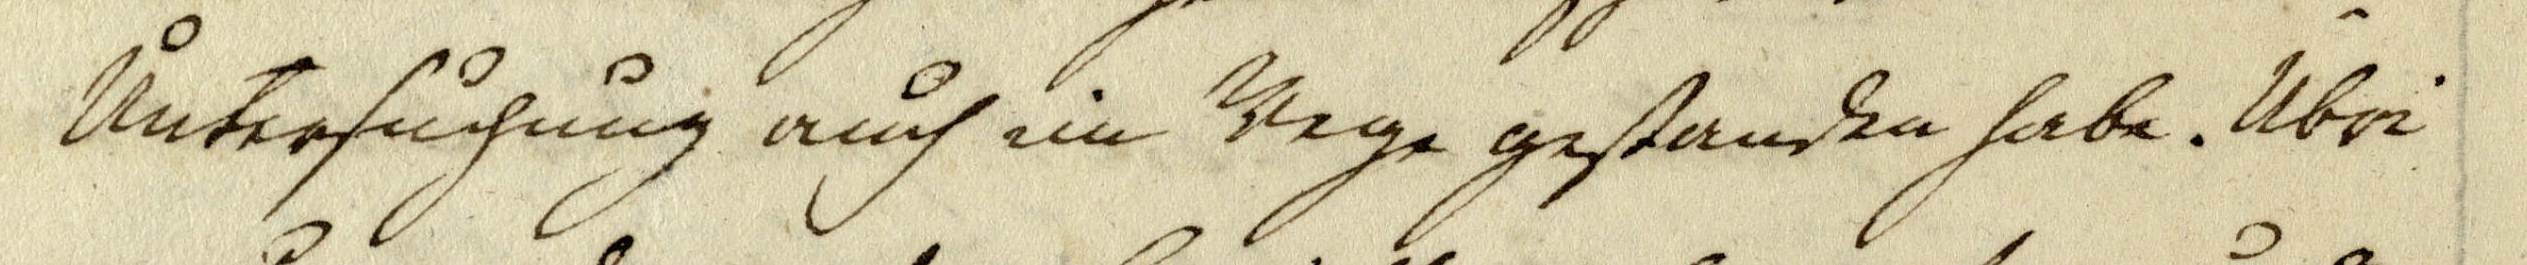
Untersuchung auch im Wege gestanden habe. Übri¬
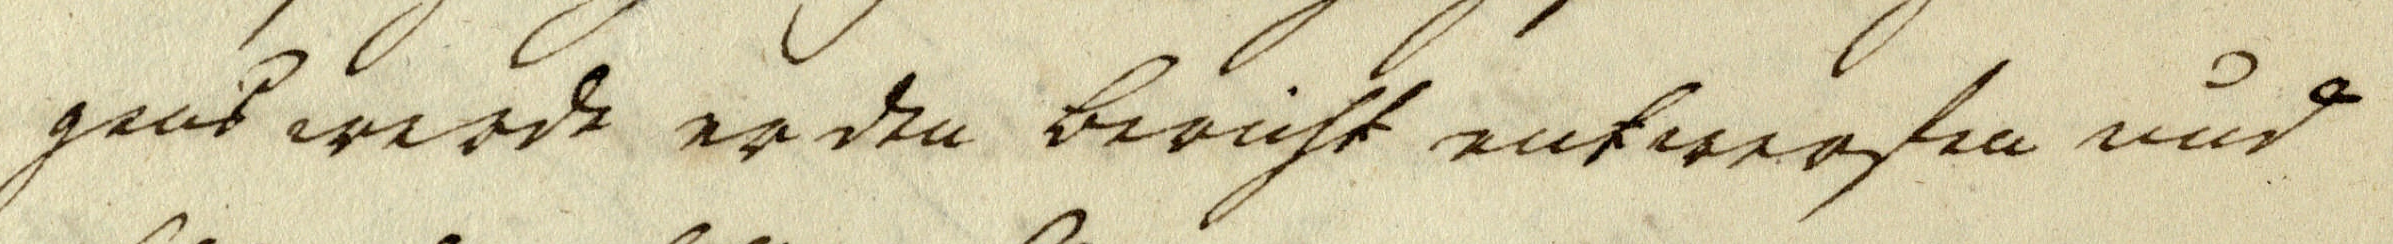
gens werde er den Bericht entwerfen und
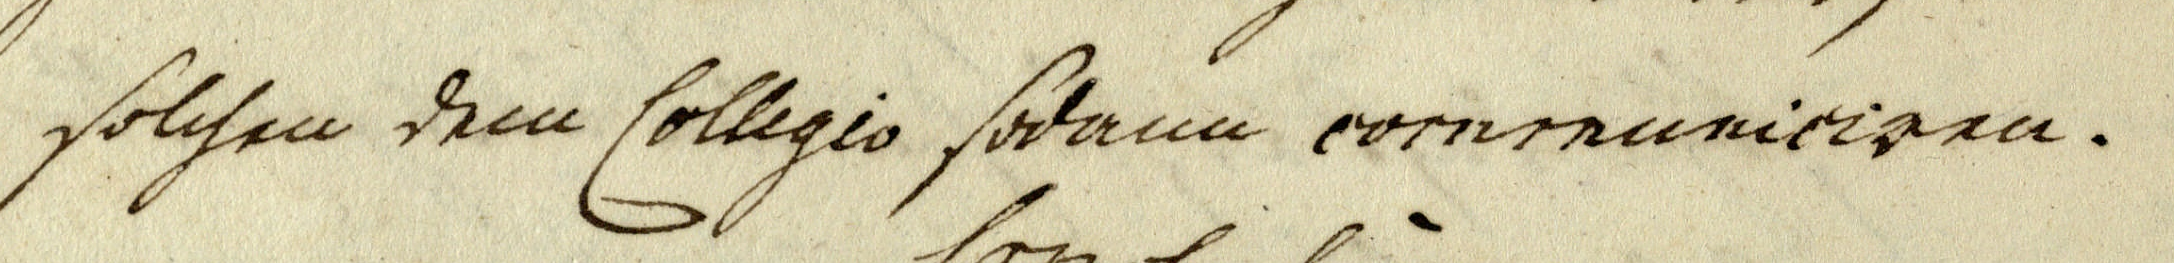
solchen dem Collegio sodann communiciren.
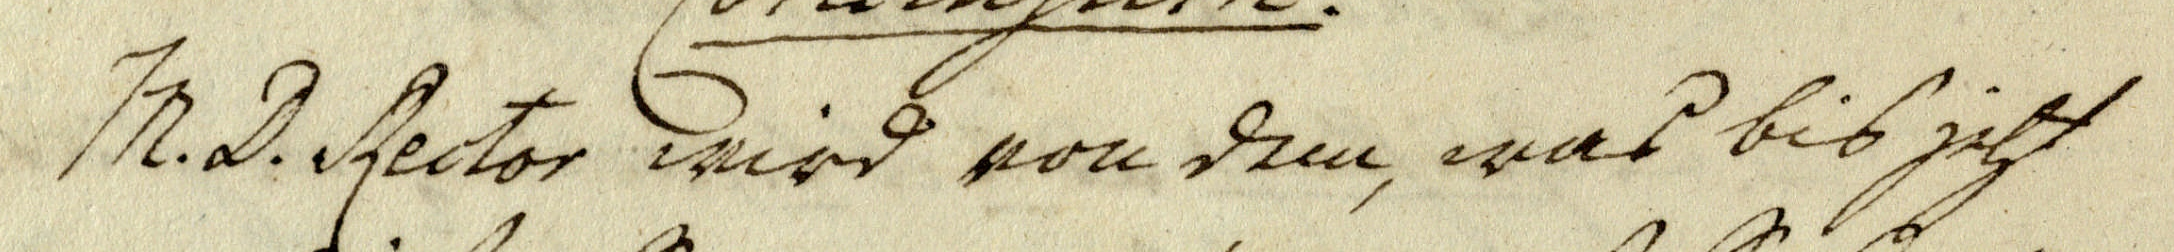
M. D. Rector wird von dem, was bis jetzt
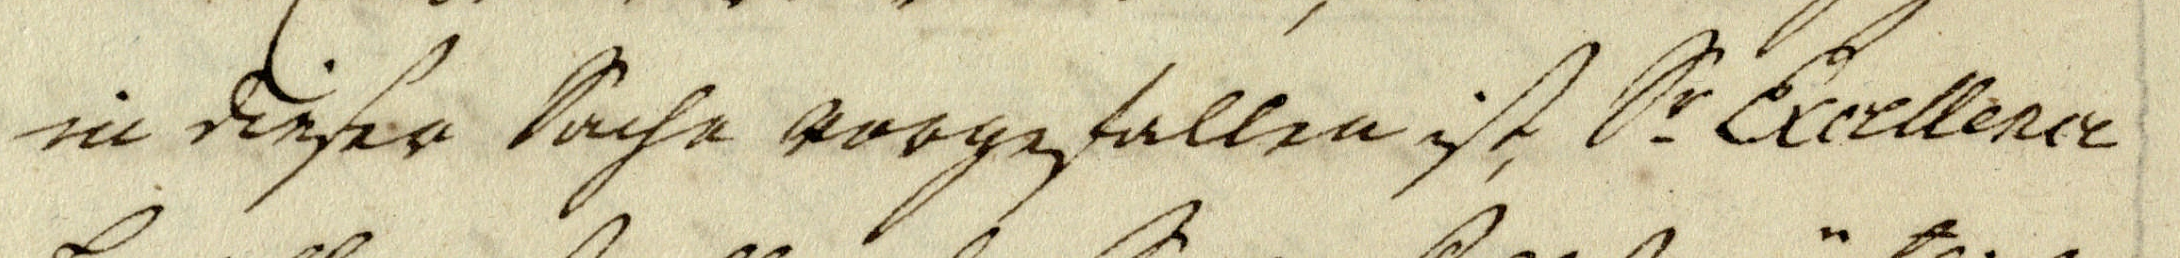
in dieser Sache vorgefallen is,t Sr Excellence
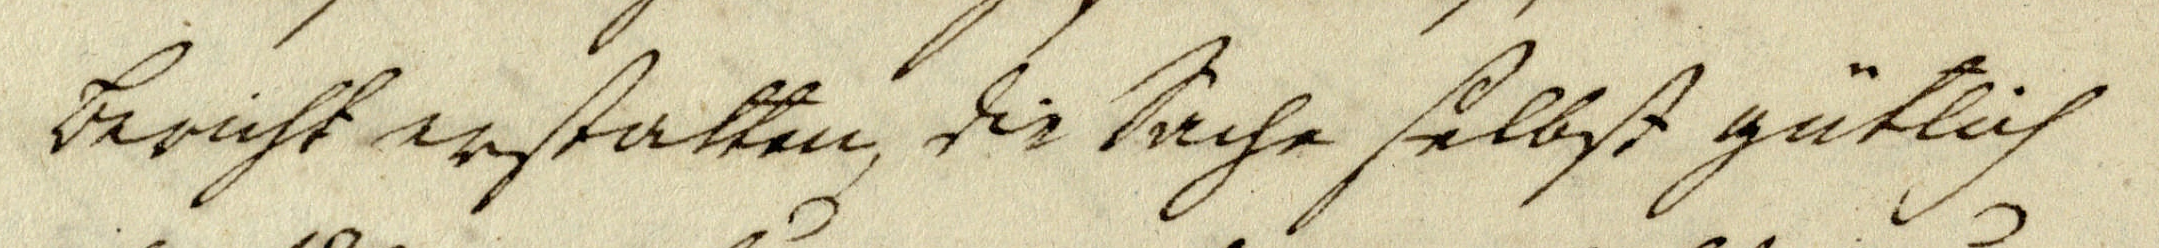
Bericht erstatten, die Sache selbst gütlich
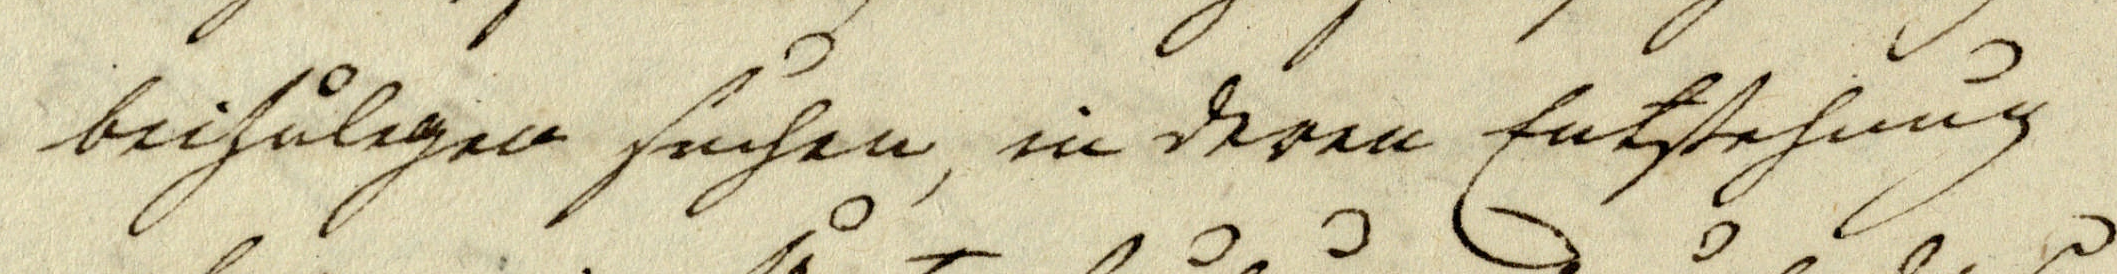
beizulegen suchen, in deren Entstehung
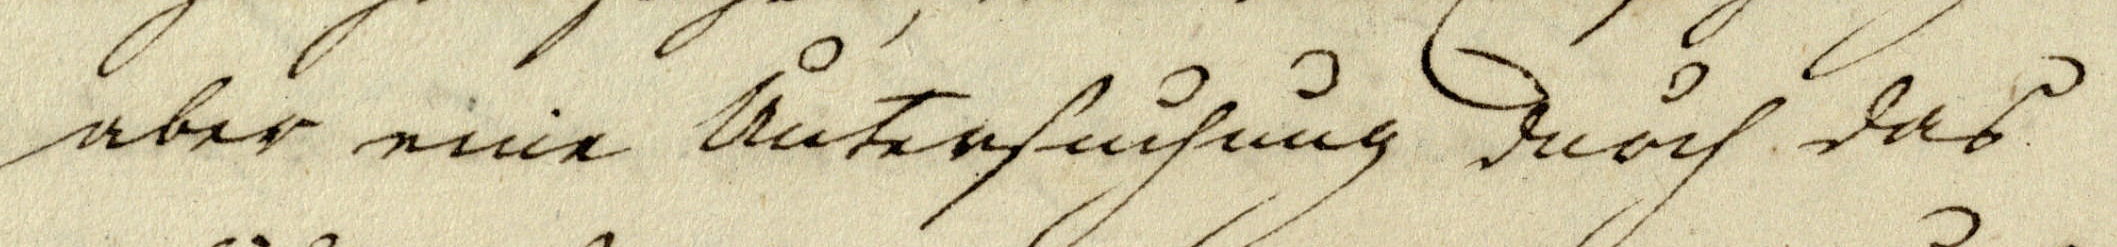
aber eine Untersuchung durch das
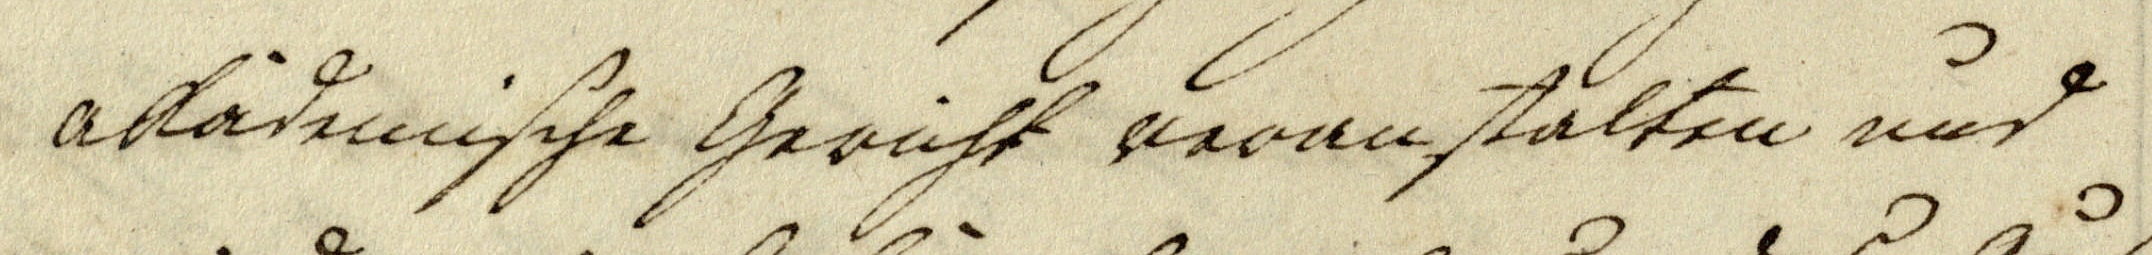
akademische Gericht veranstalten und
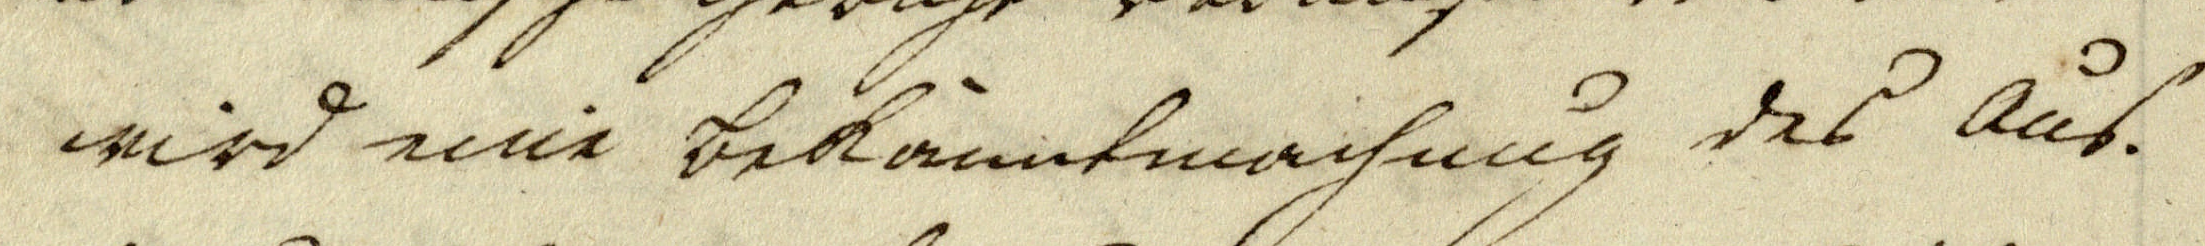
wird eine Bekanntmachung des Aus¬
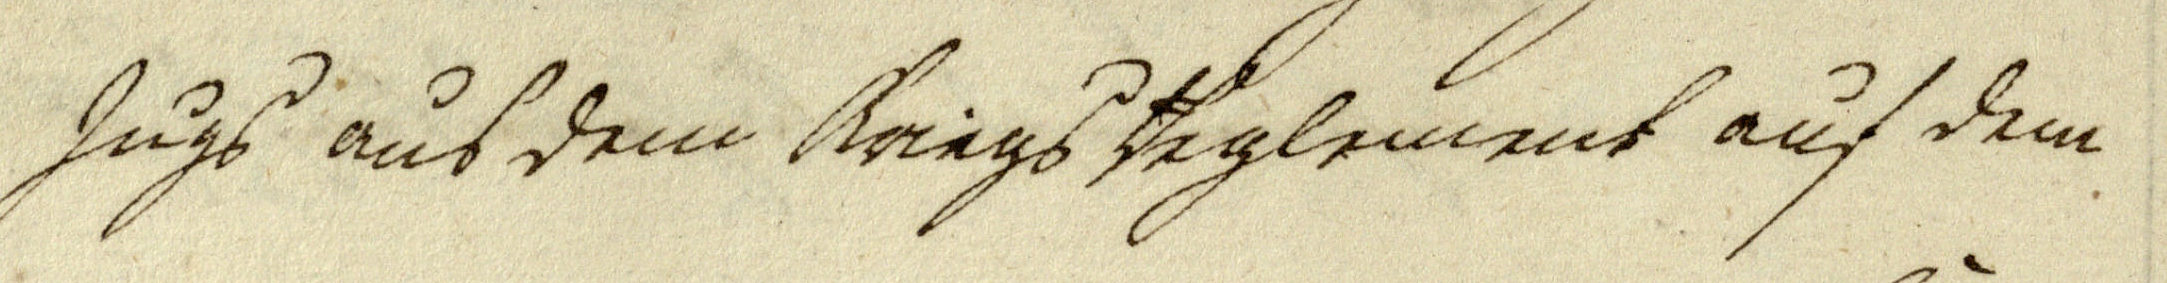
zugs aus dem KriegsReglement auf dem
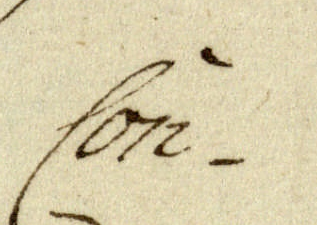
Con¬
